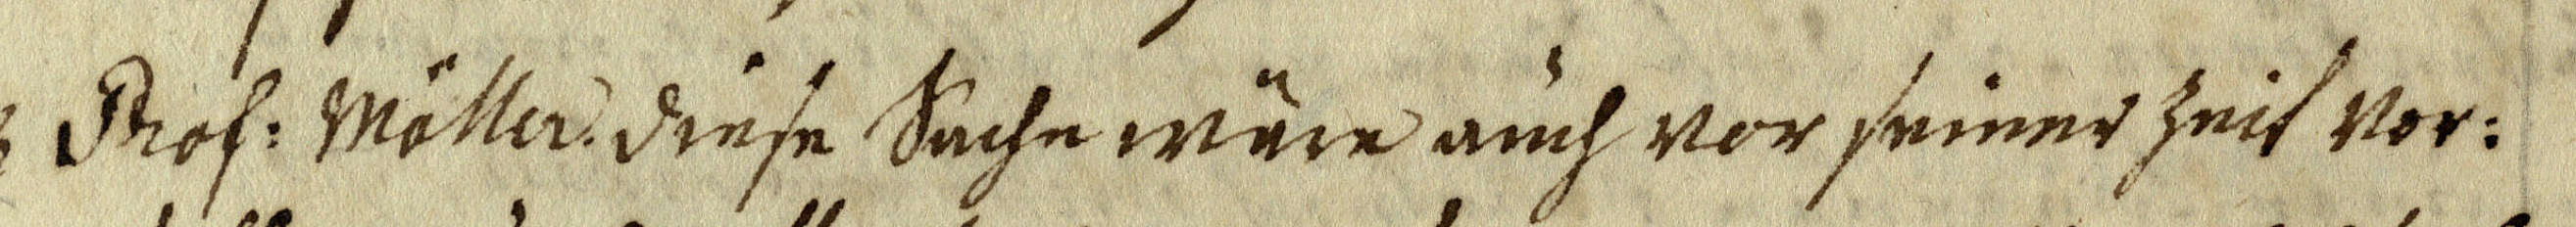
dh Prof. Möller. Diese Sache wäre auch vor seiner Zeit vor¬
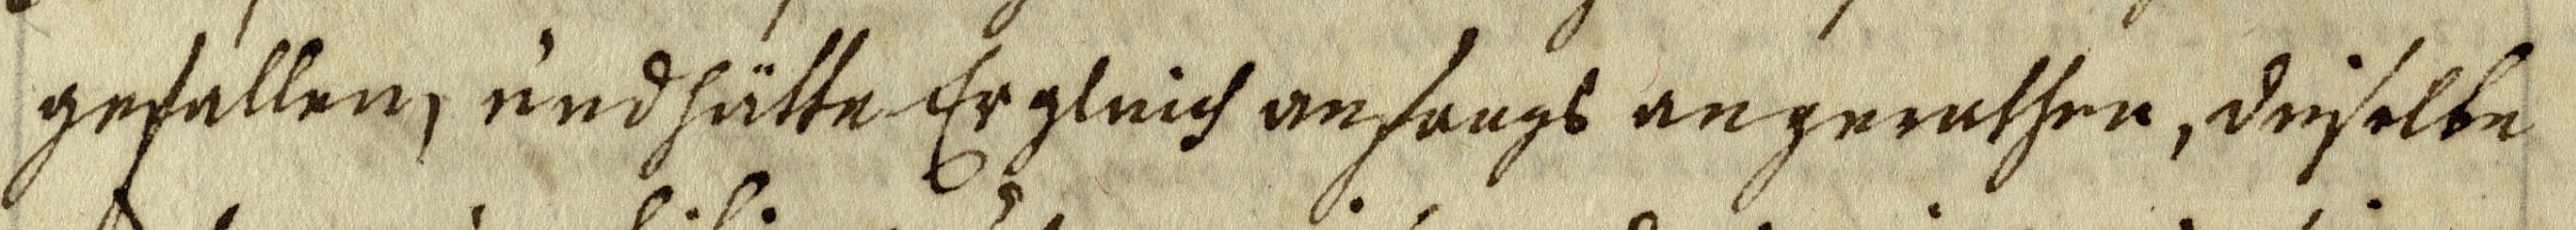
gefallen, und hätte Er gleich anfangs angerathen, dieselbe
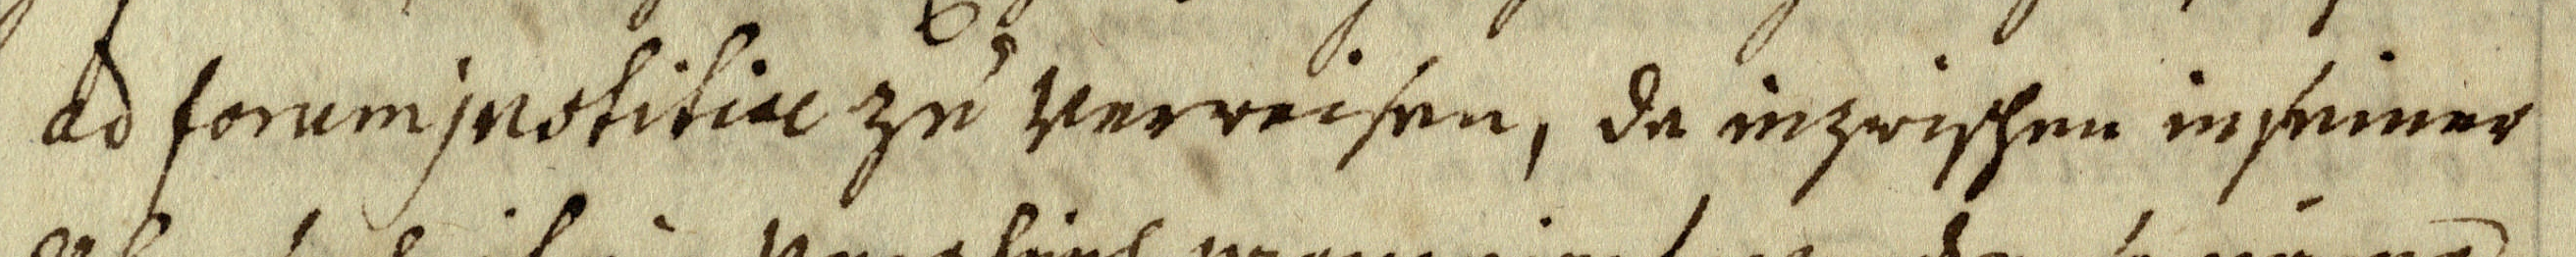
ad forum justitiae zu verweisen, da inzwischen in seiner
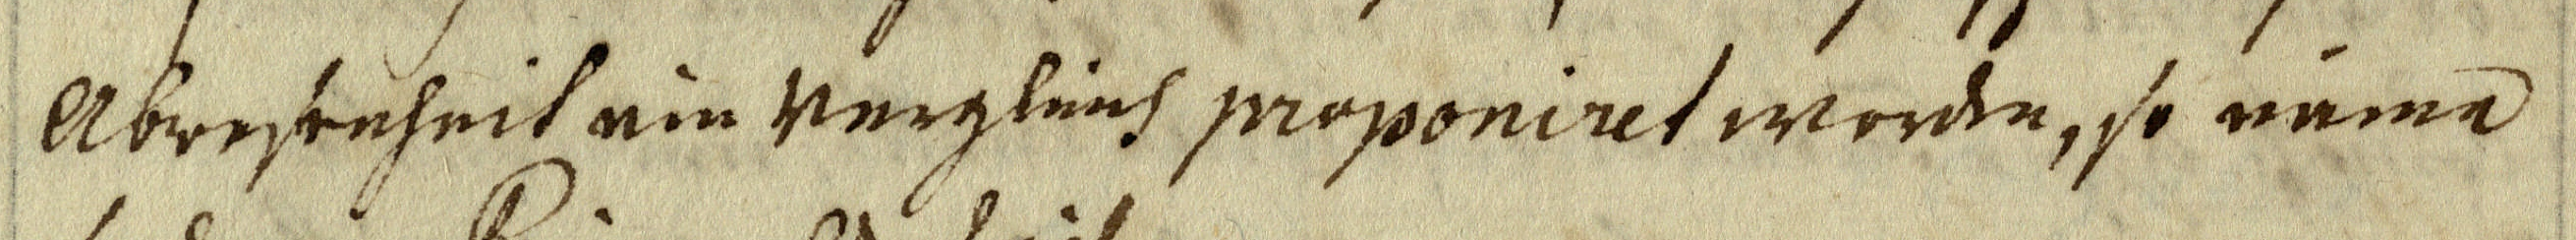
Abwesenheit ein Vergleich proponiret worden, so näme
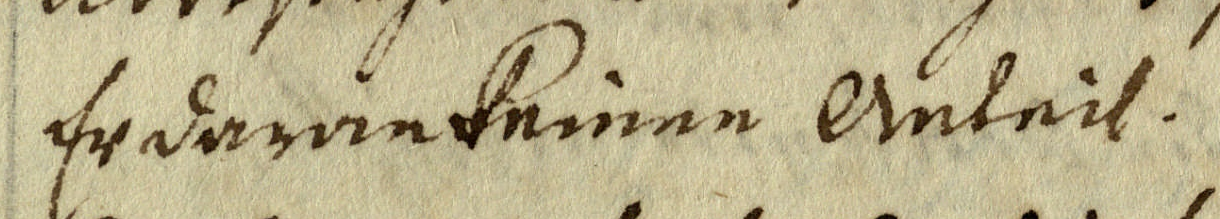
Er darin keinen Anteil.
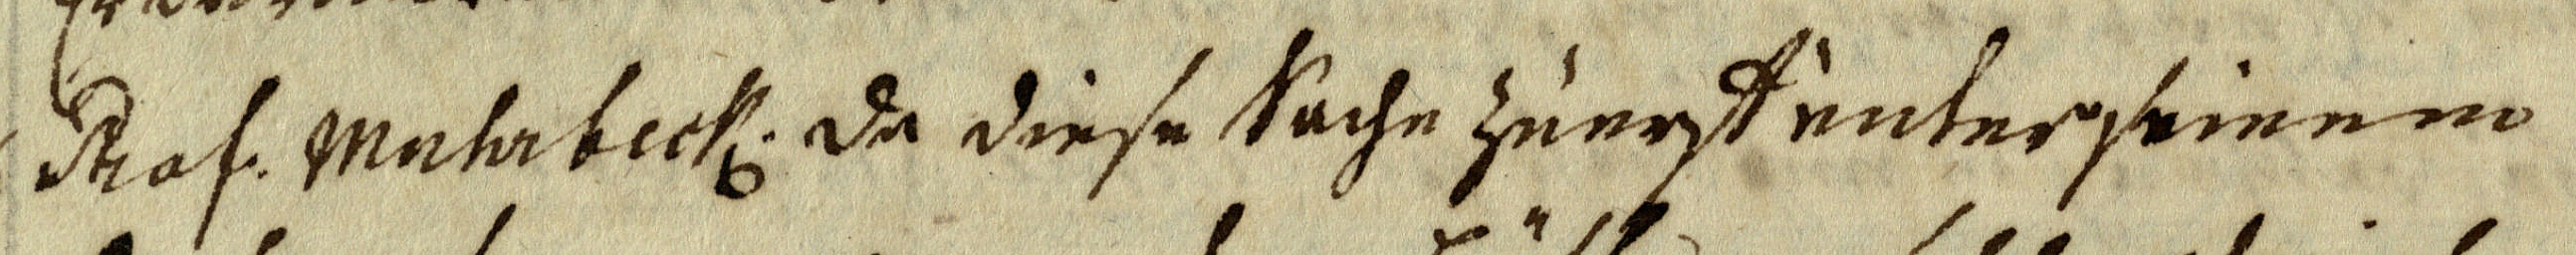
dh Prof. Muhrbeck. Da diese Sache zuerst unter seinem
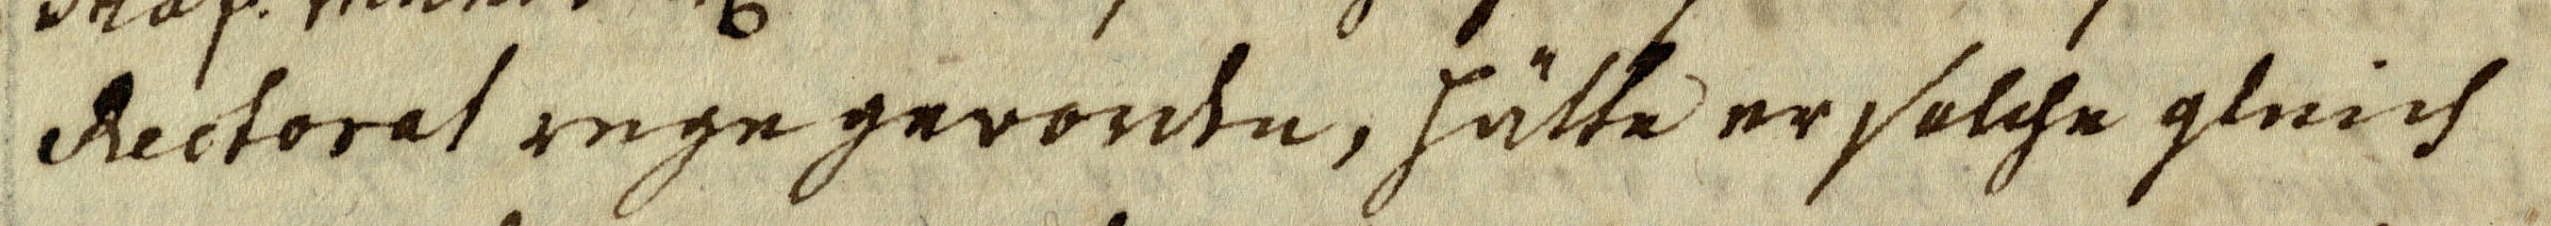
Rectorat rege geworden, hätte er solche gleich
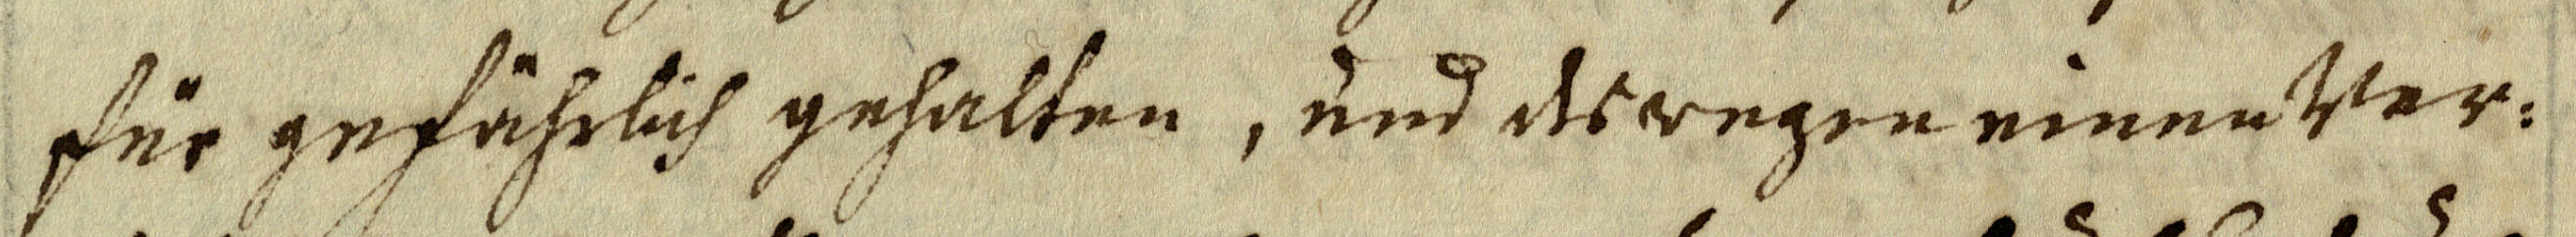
für gefährlich gehalten, und deswegen einen Ver¬
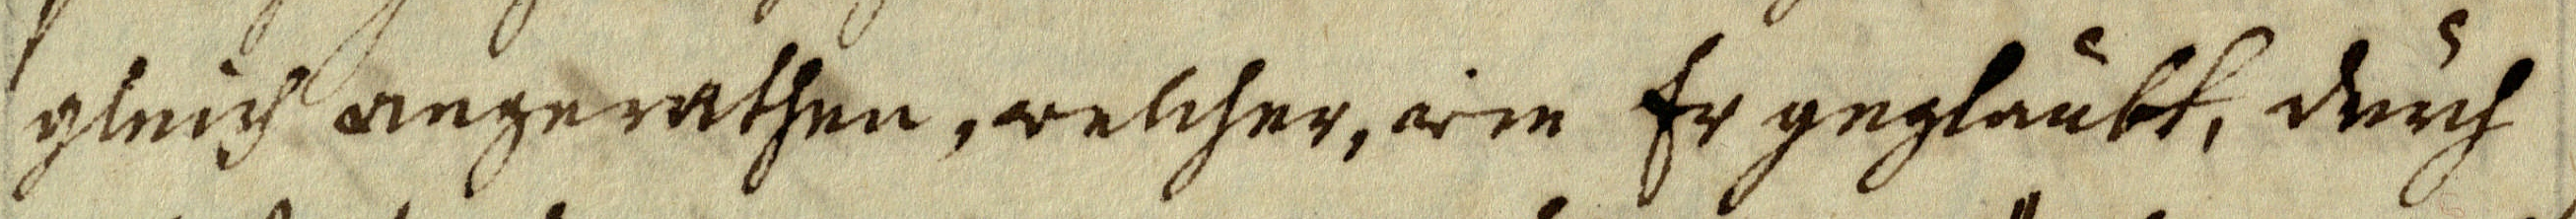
gleich angerathen, welcher, wie Er geglaubt, durch
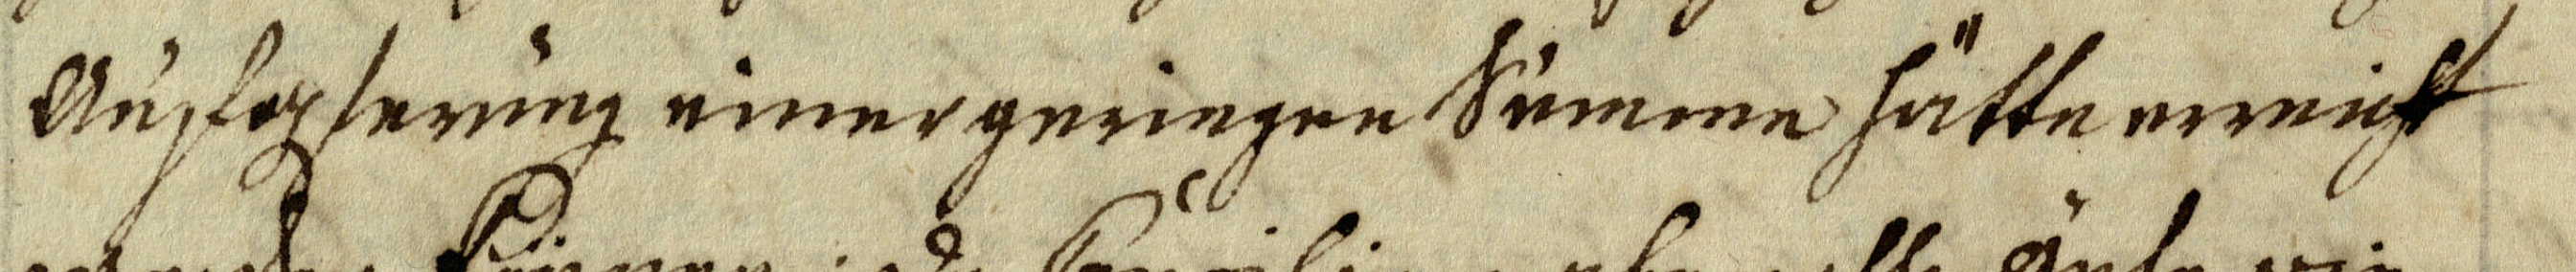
Aufopferung einer geringen Summe hätte erreicht
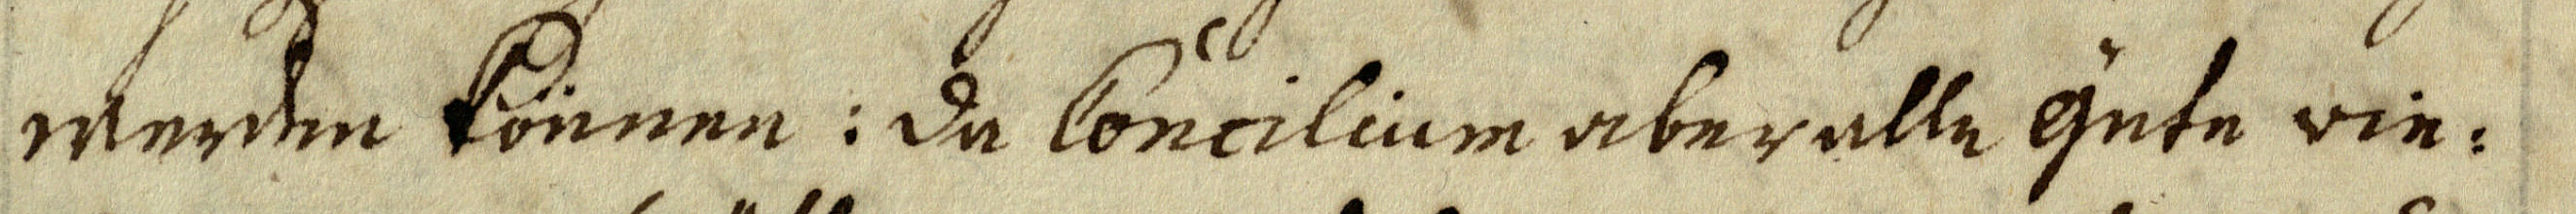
werden können. Da Concilium aber alle Güte wie¬
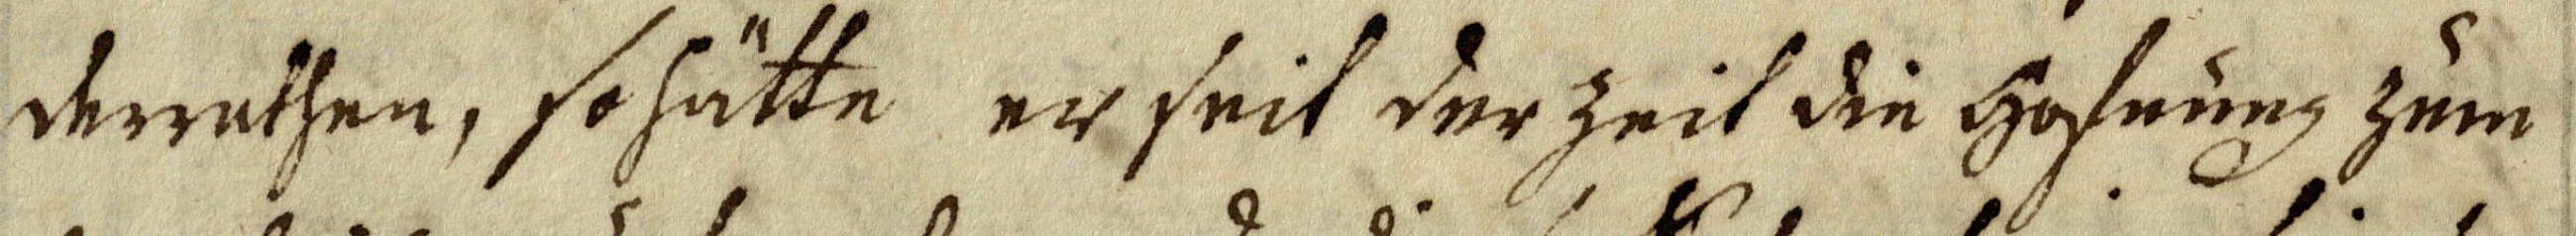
derrathen, so hätte er seit der Zeit die Hofnung zum
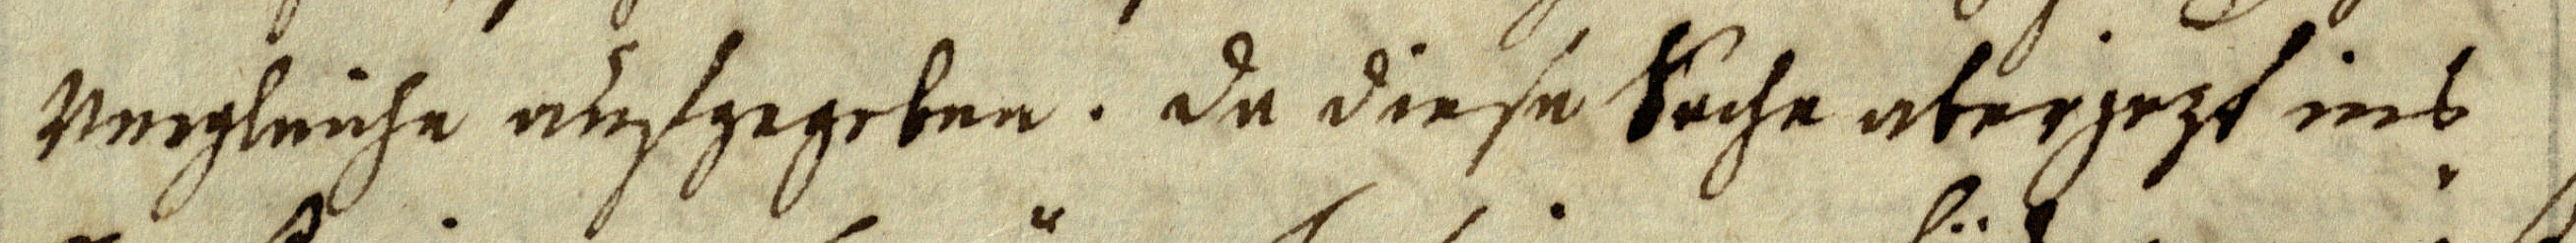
Vergleiche aufgegeben. Da diese Sache aber jezt ins
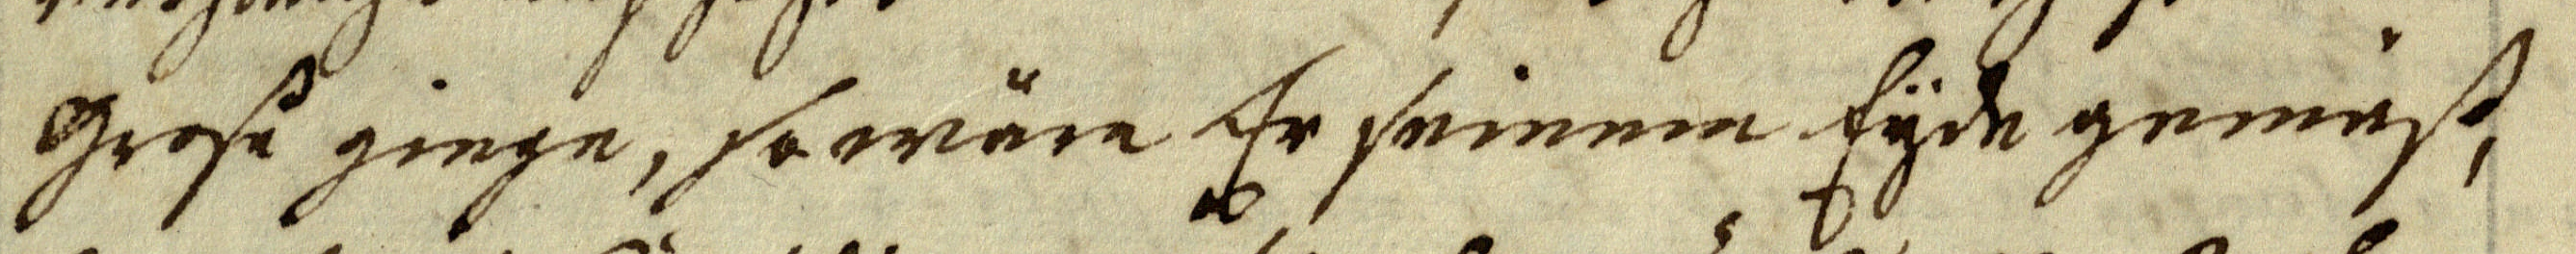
Große ginge, so wäre Er seinem Eÿde gemäß,
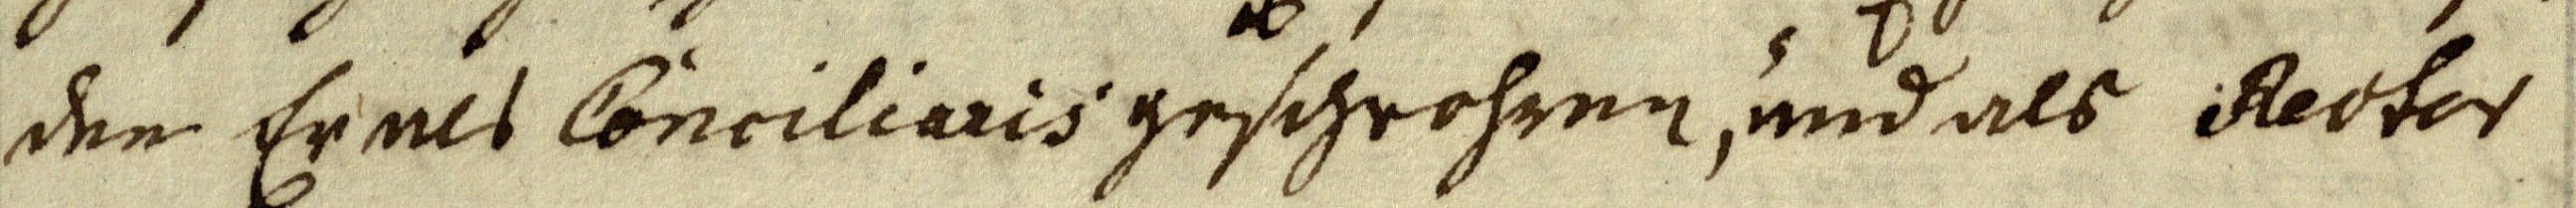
den Er als Conciliaris geschwohren, und als Rector
